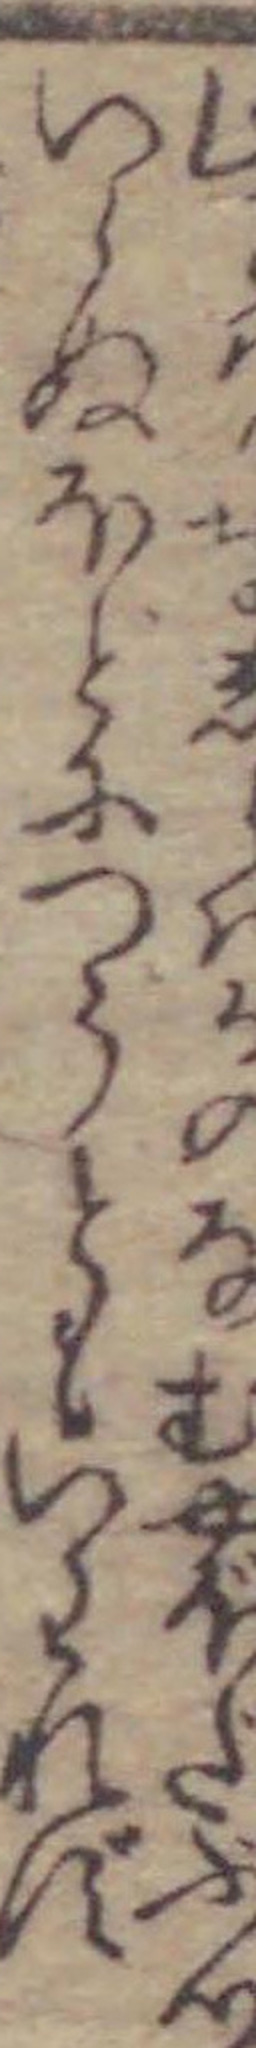いらぬほどにつうともいわれず
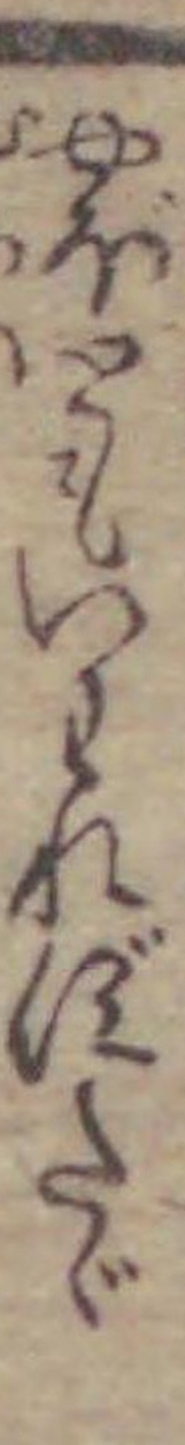やぼともいわれずたゞ
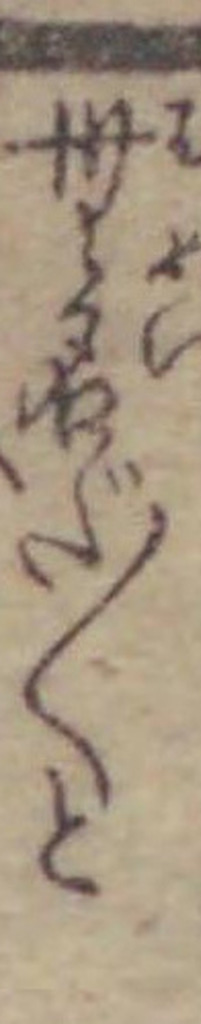無名だ〳〵と
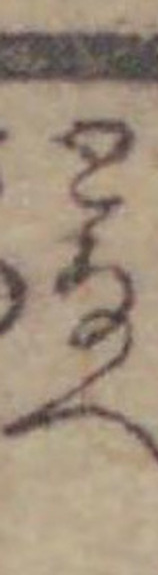となへ
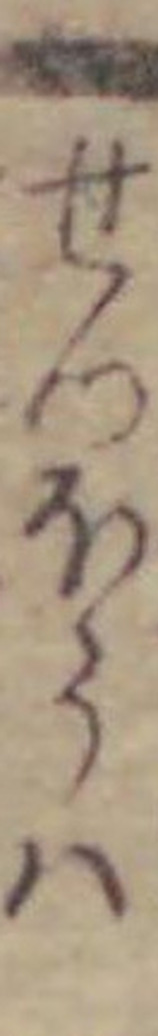せつほうは
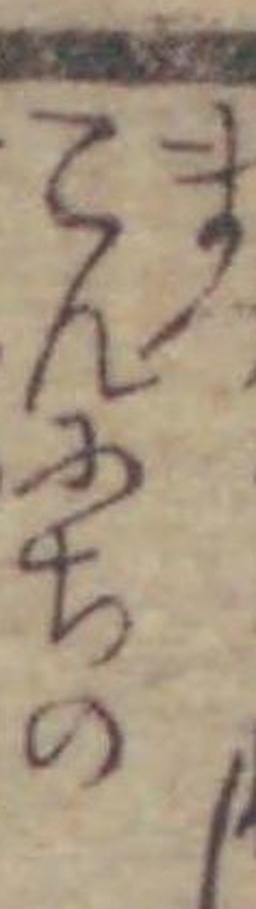こんにちの
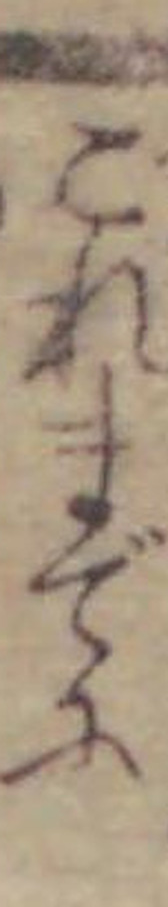これまでに
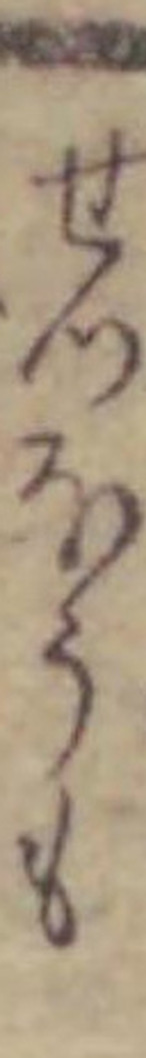せつほうも
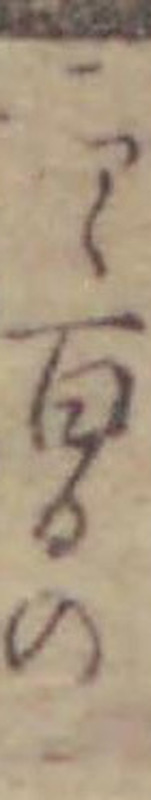「アゝ百日の
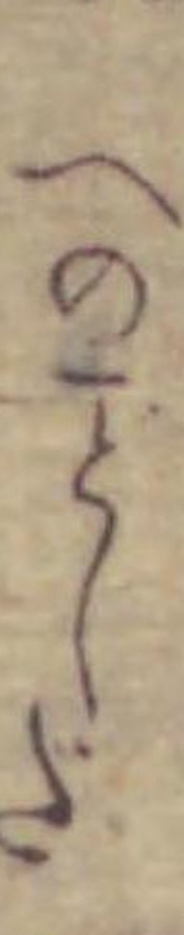への一としだ
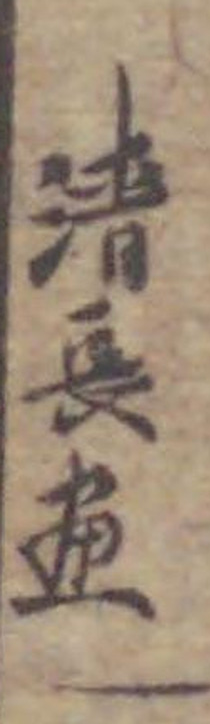清長画
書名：九替十年色地獄 : 3巻
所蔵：国立国会図書館 National Diet Library, JAPAN
